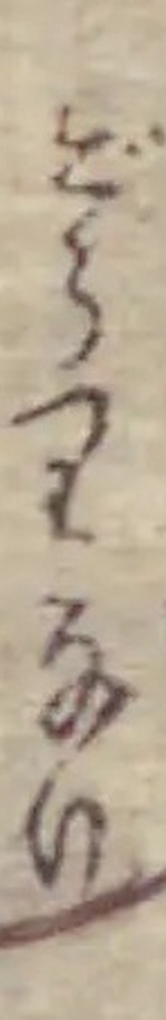どうりなり
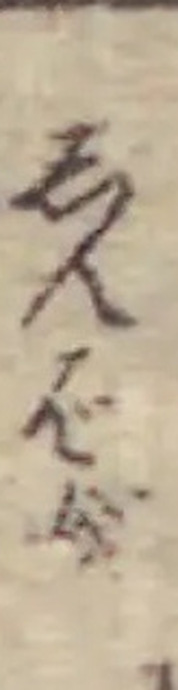しんばが
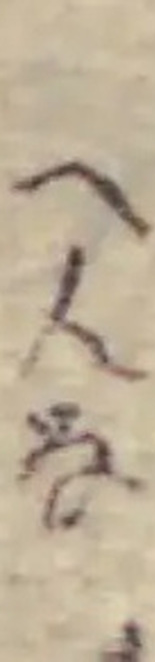へんな
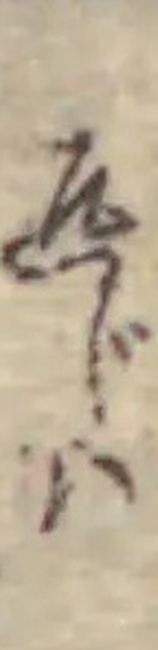返じは
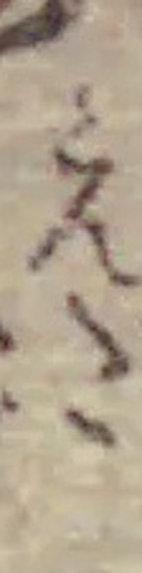とんだ
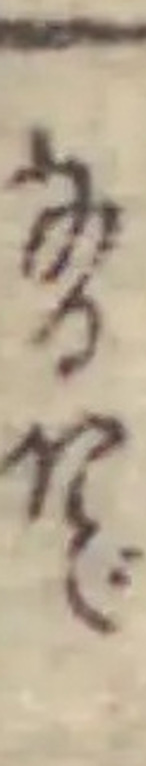なるほど
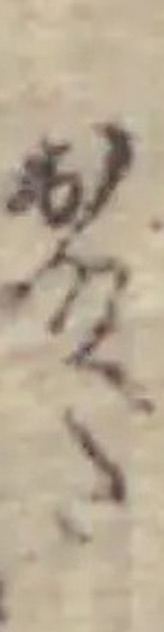おほへた
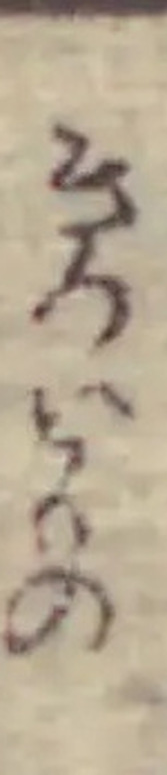きついかの
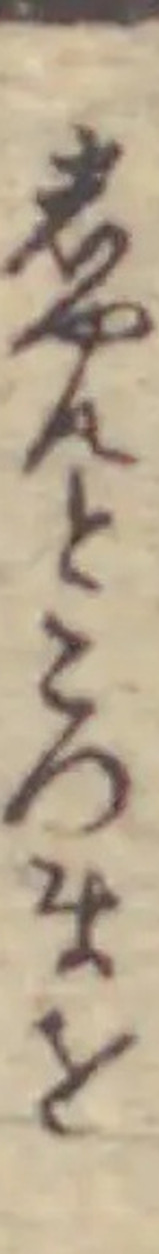しやんとこつまを
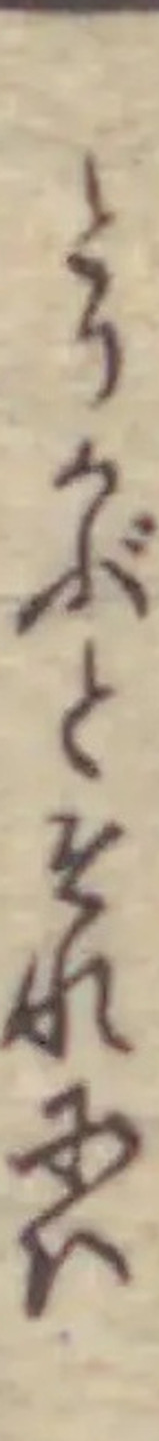とりかぶとそれには
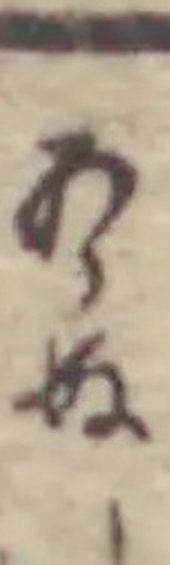あらぬ
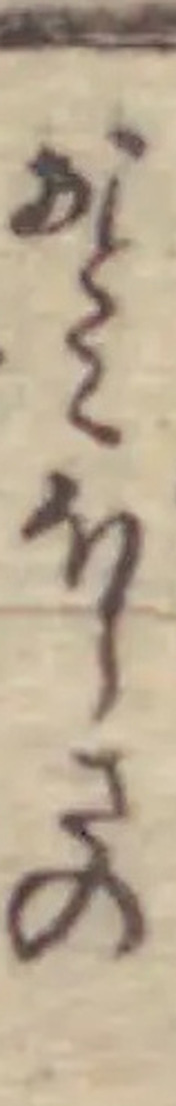おとみほしさの
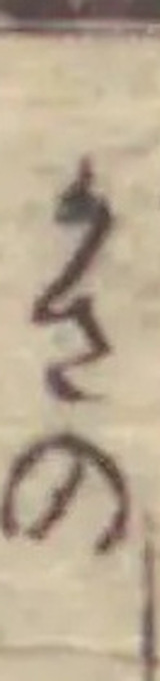かさの
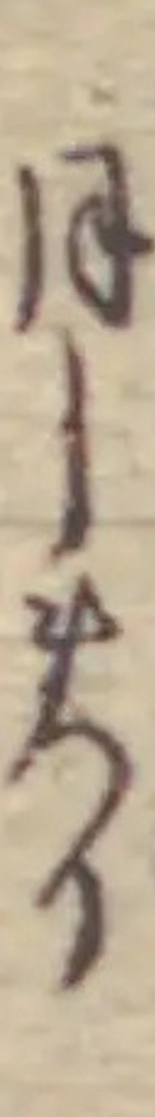同しまつり
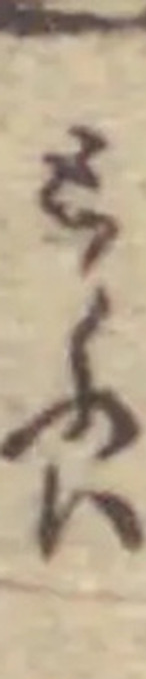とふは
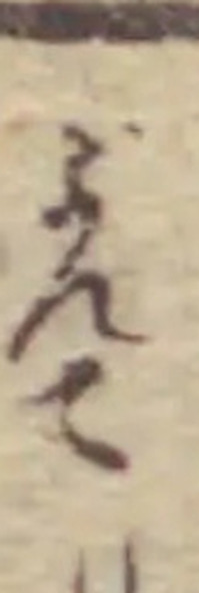よんて
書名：夜野中狐物 2巻
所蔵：国立国会図書館 National Diet Library, JAPAN
